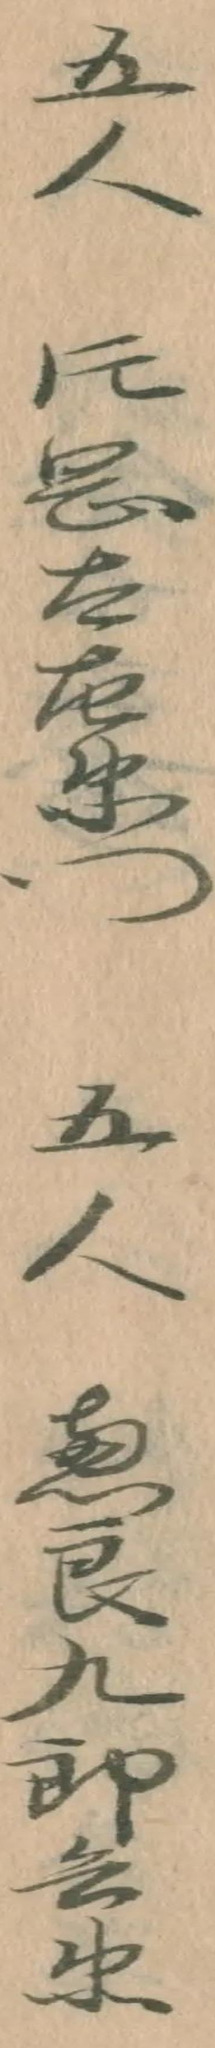五人片岡太左衛門五人恵良九郎兵衛
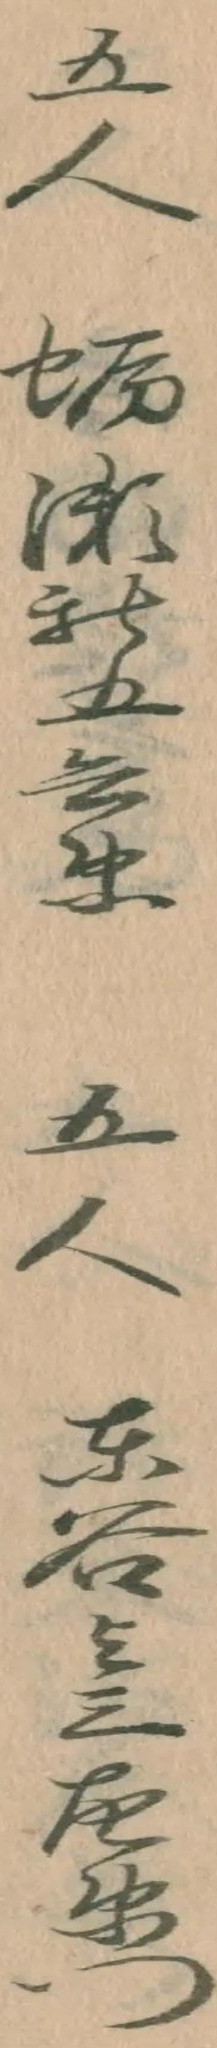五人蛎瀬新五兵衛五人東谷与三左衛門
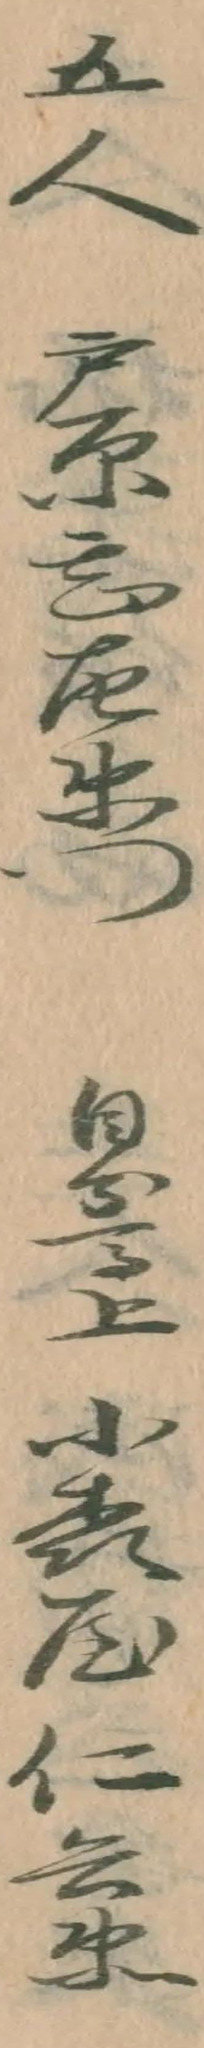五人戸原甚左衛門自分馬上小森屋仁兵衛
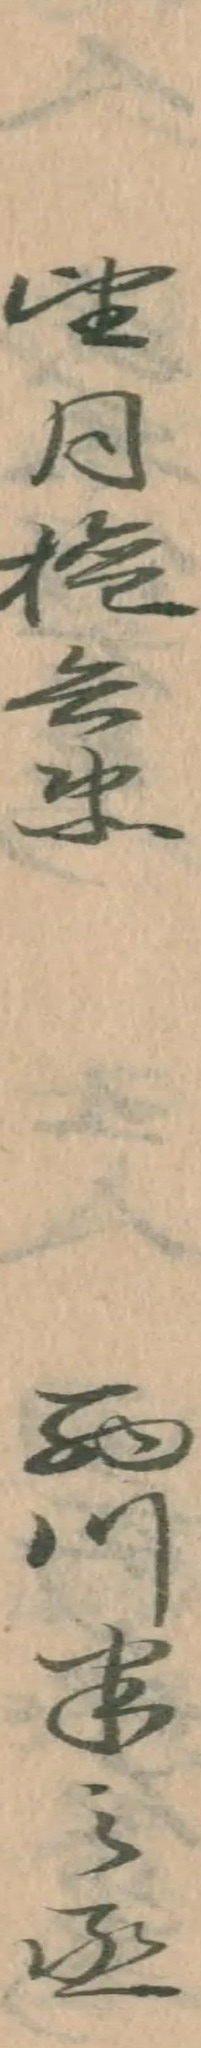望月権兵衛西川半之丞
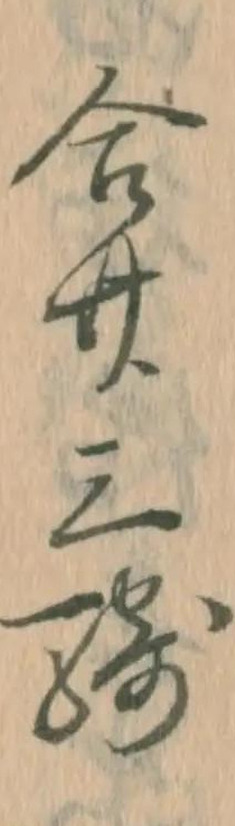合廿三騎
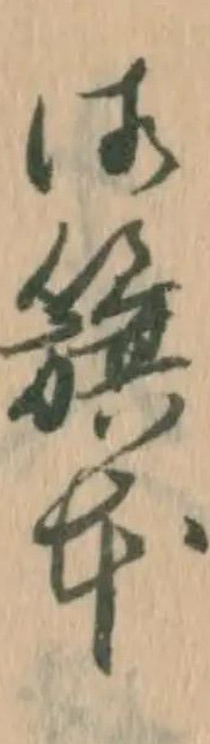御旗本
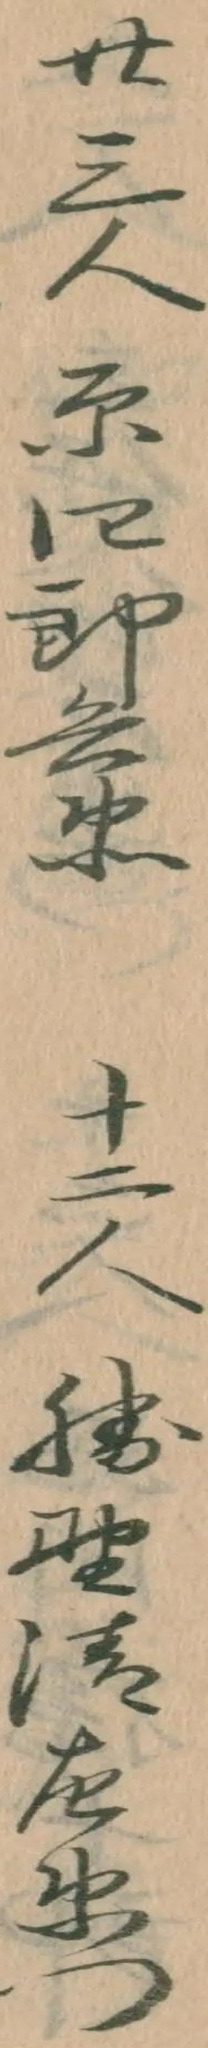廿三人原四郎兵衛十二人勝野清左衛門
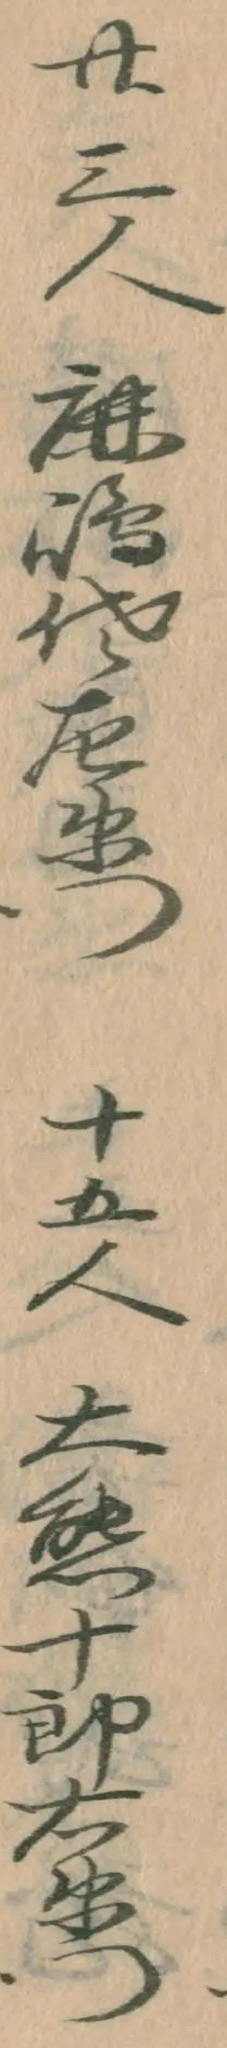廿三人鹿島佐左衛門十五人大熊十郎右衛門
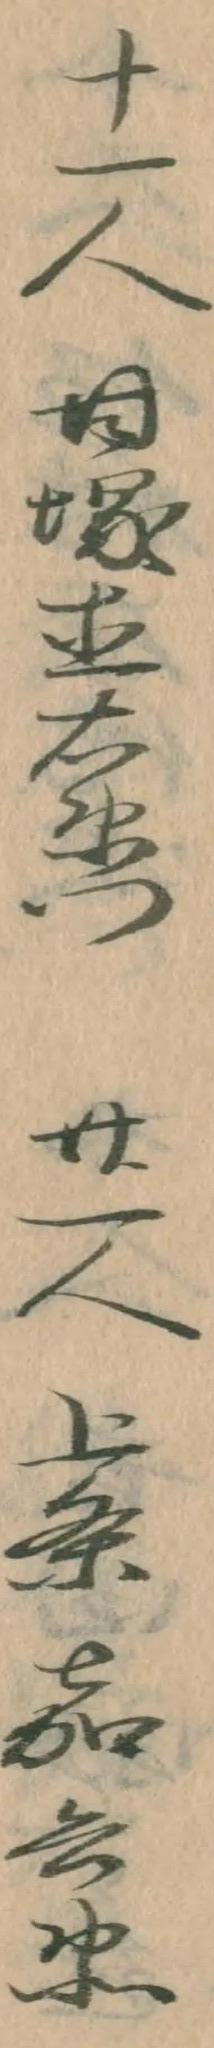十一人甘塚直右衛門廿一人上条嘉兵衛
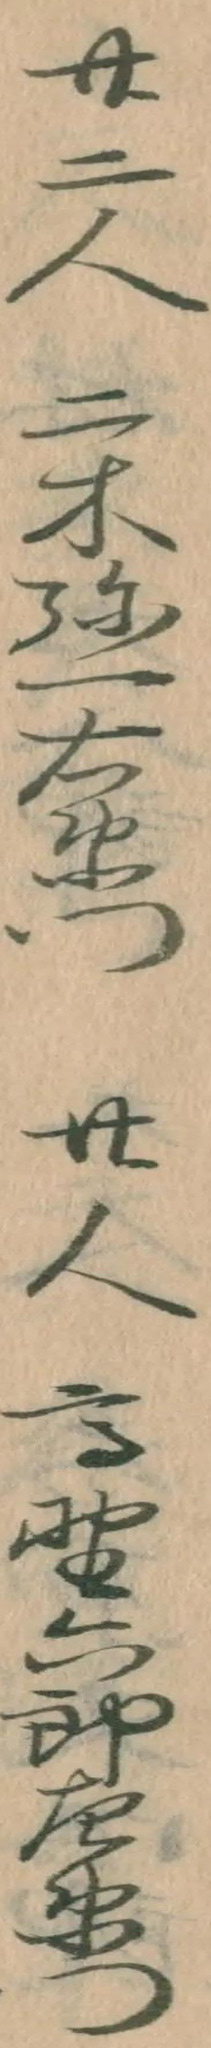廿二人二木弥一右衛門廿人高野六郎左衛門
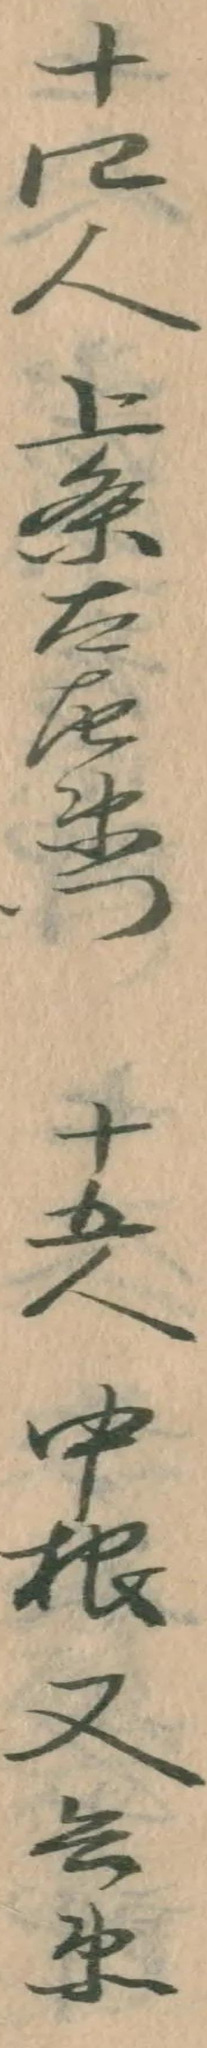十四人上条太左衛門十五人中根又兵衛
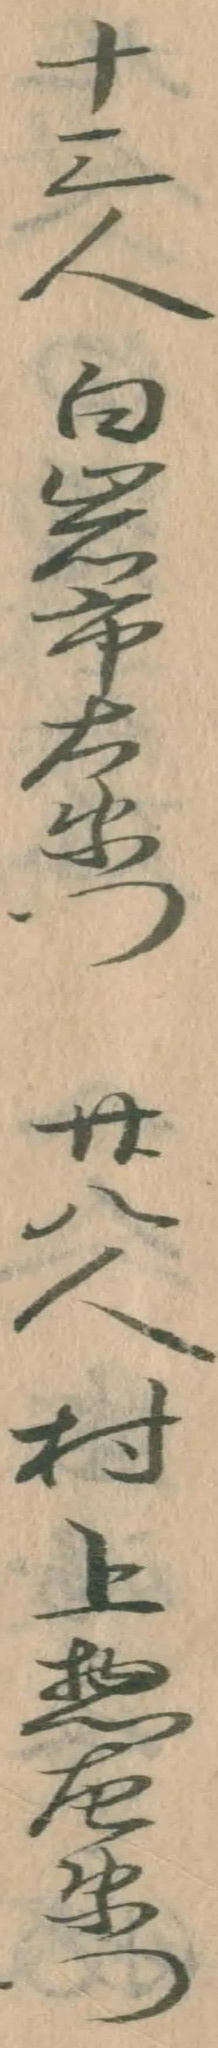十三人白岩市右衛門廿八人村上惣左衛門
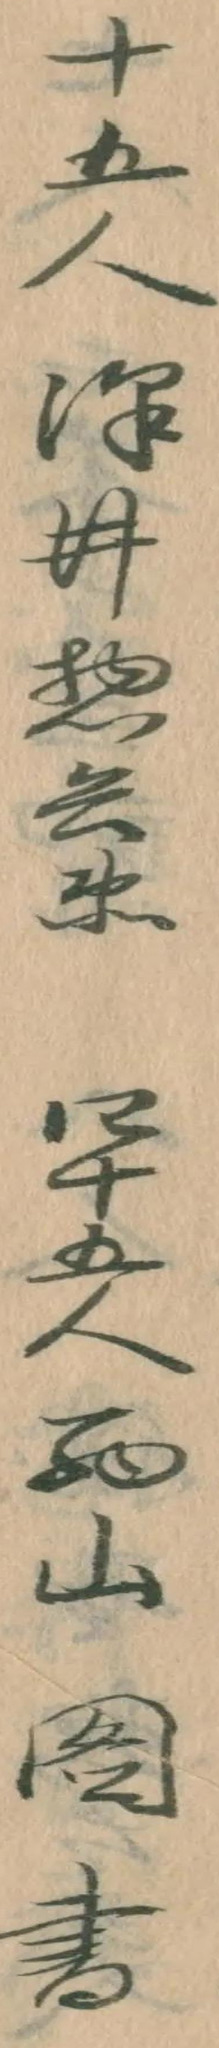十五人沢井惣兵衛四十五人西山閣書
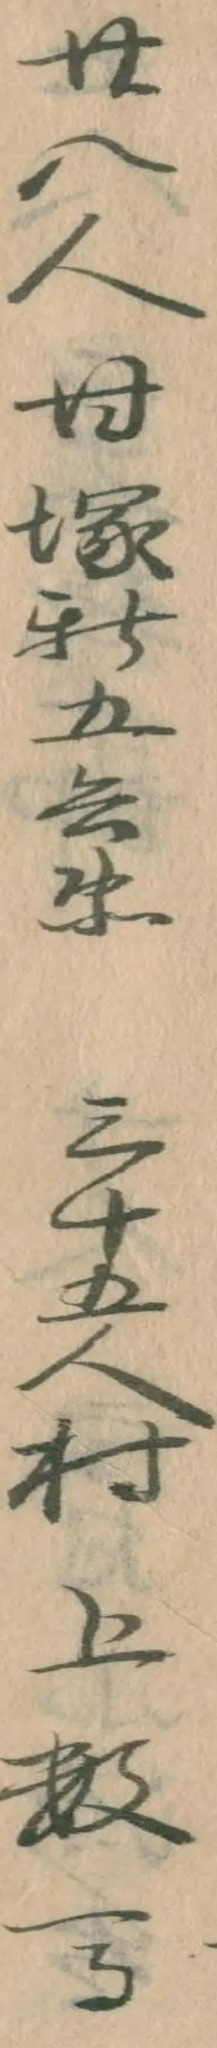廿八人甘塚新五兵衛三十五人村上数馬
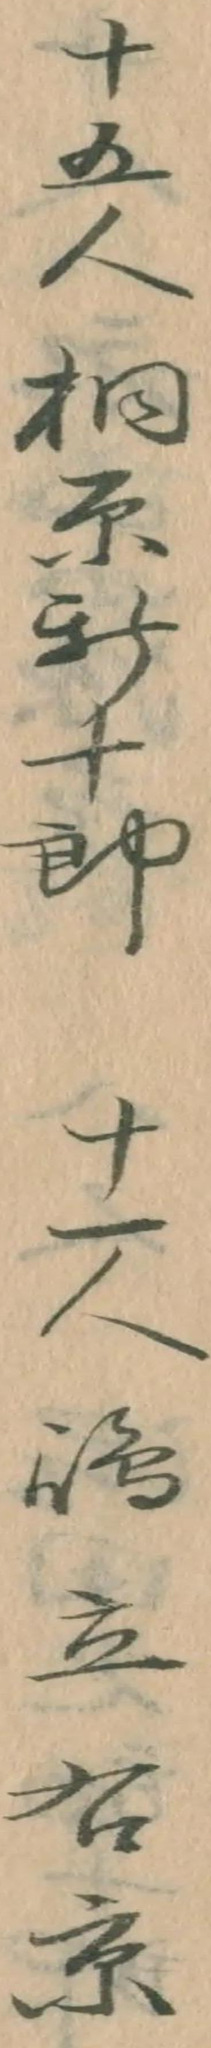十五人相原新十郎十一人島立右京

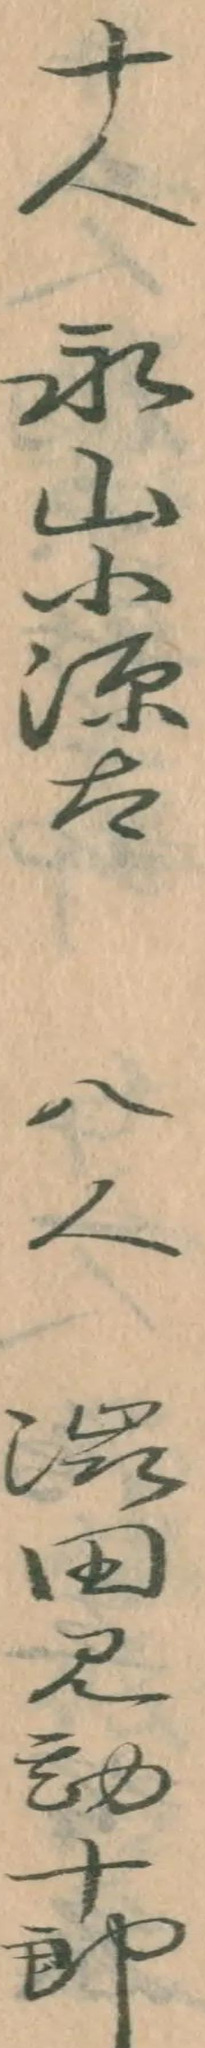十人永山小源太八人渋田見勘十郎
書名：切支丹御退治記 49巻. [6]
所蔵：国立国会図書館 National Diet Library, JAPAN
